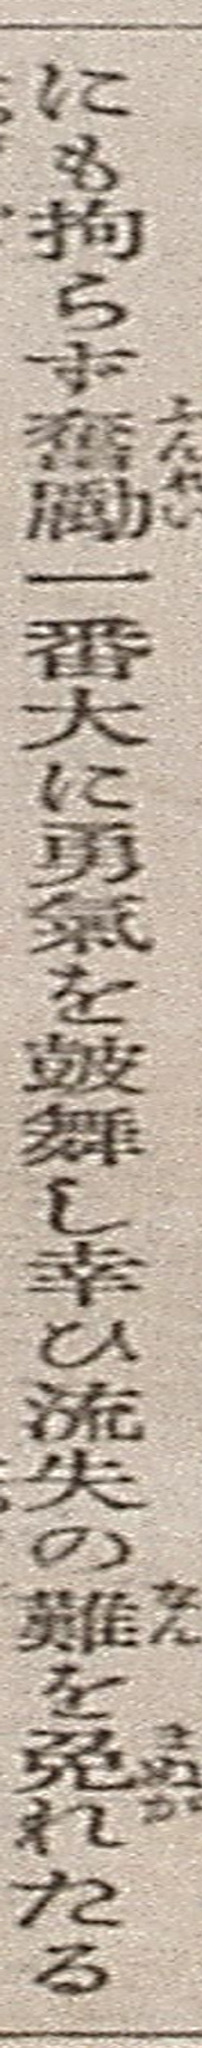にも拘らず奮励一番大に勇気を鼓舞し幸ひ流失の難を免れたる
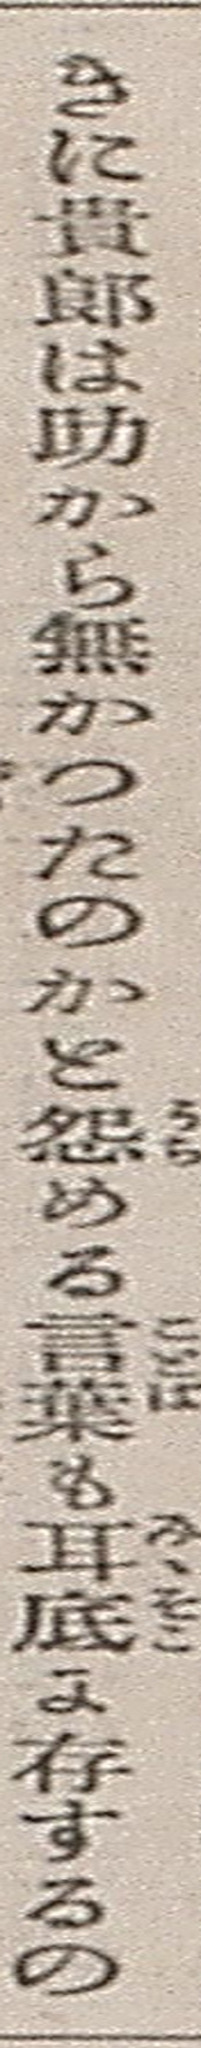きに貴郎は助から無かつたのかと怨める言葉も耳底に存するの
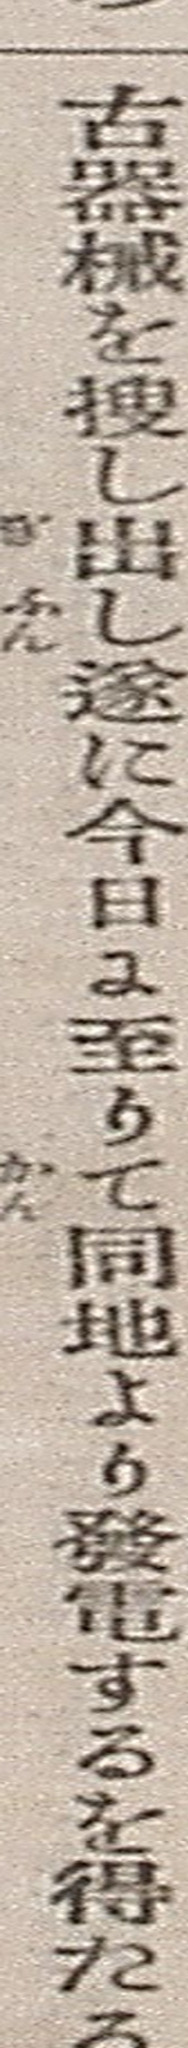古器械を捜し出し遂に今日に至りて同地より発電するを得たる
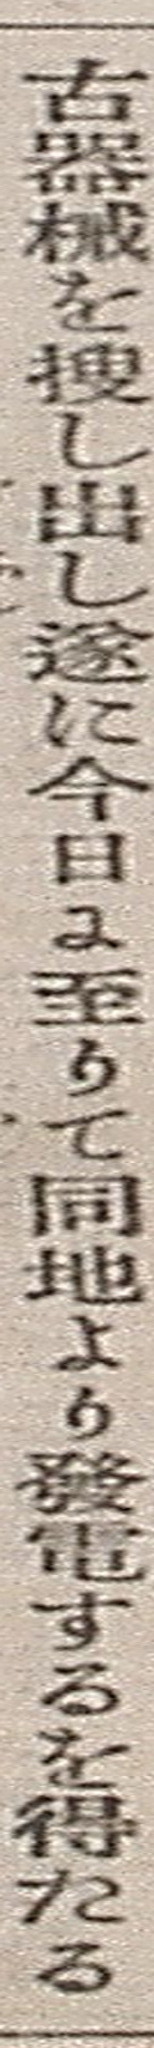古器械を捜し出し遂に今日に至りて同地より発電するを得たる
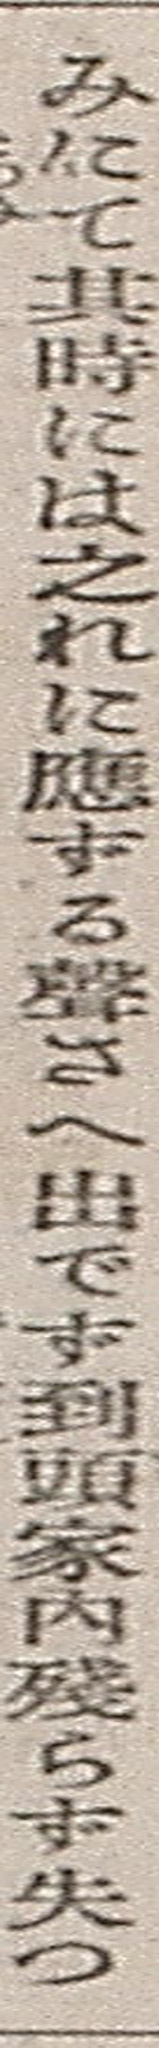みにて其時には之れに応ずる声さへ出でず到頭家内残らず失つ
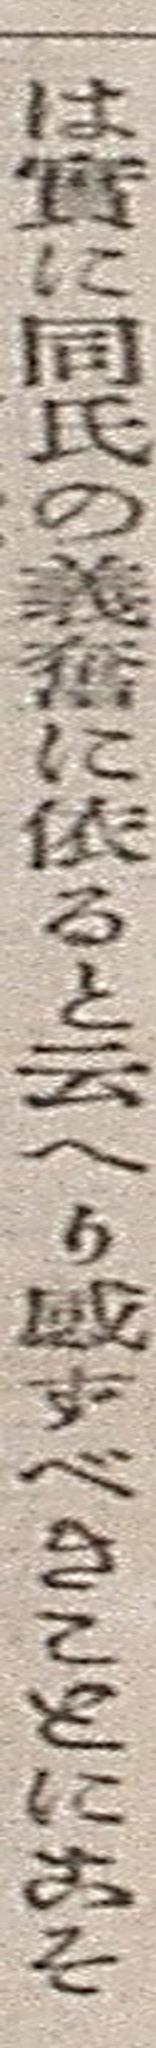は実に同氏の義奮に依ると云へり感ずべきことにこそ
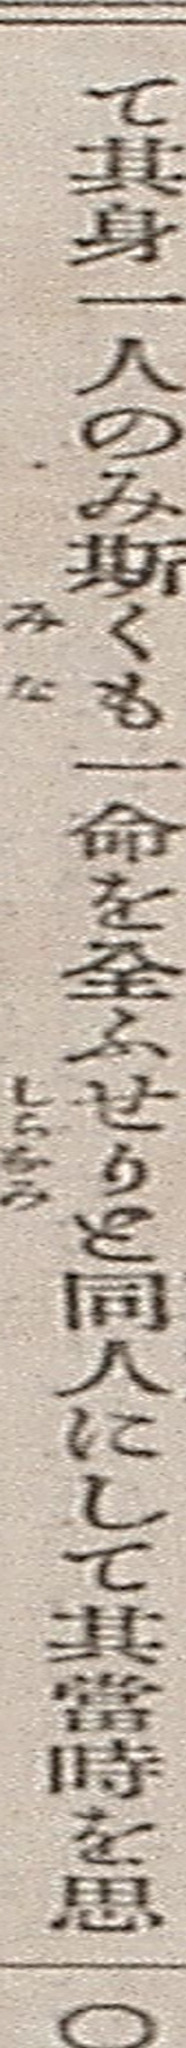て其身一人のみ斯くも一命を全ふせりと同人にして其当時を思
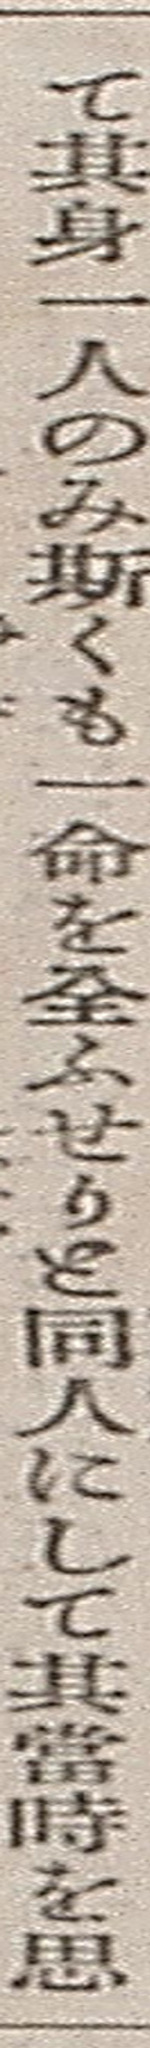て其身一人のみ斯くも一命を全ふせりと同人にして其当時を思
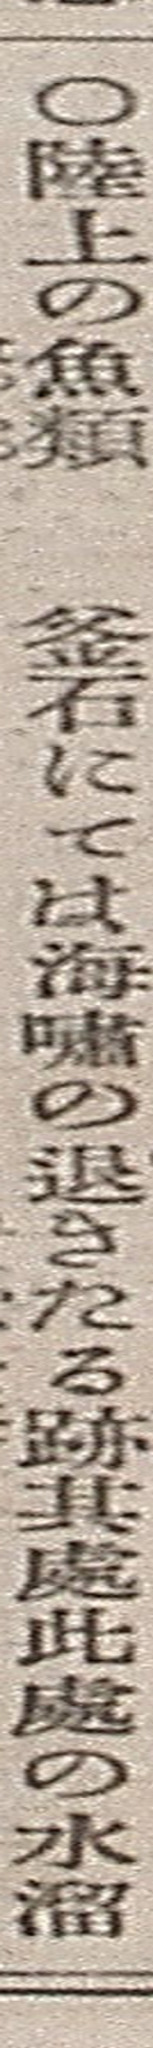○陸上の魚類釜石にては海嘯の退きたる跡其処此処の水溜
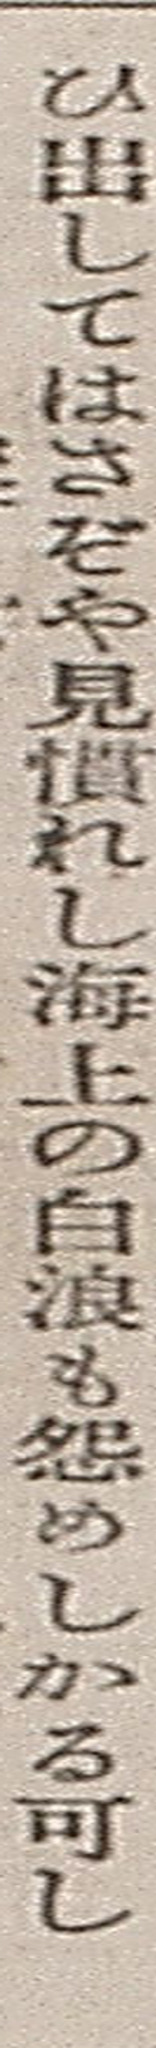ひ出してはさぞや見慣れし海上の白浪も怨めしかる可し
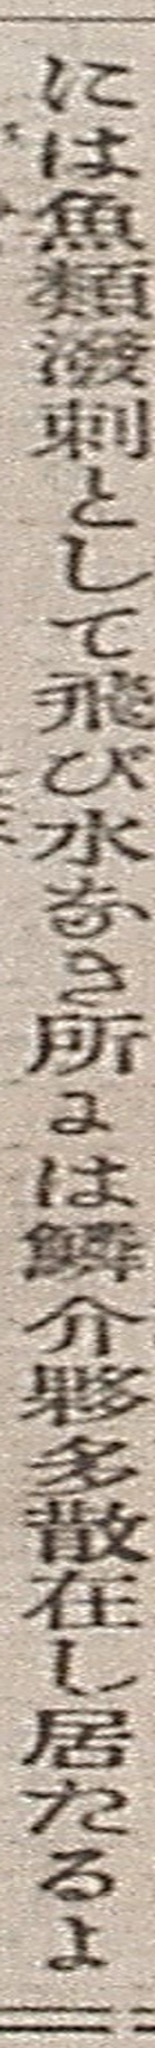には魚類溌剌として飛び水なき所には鱗介夥多散在し居たるよ
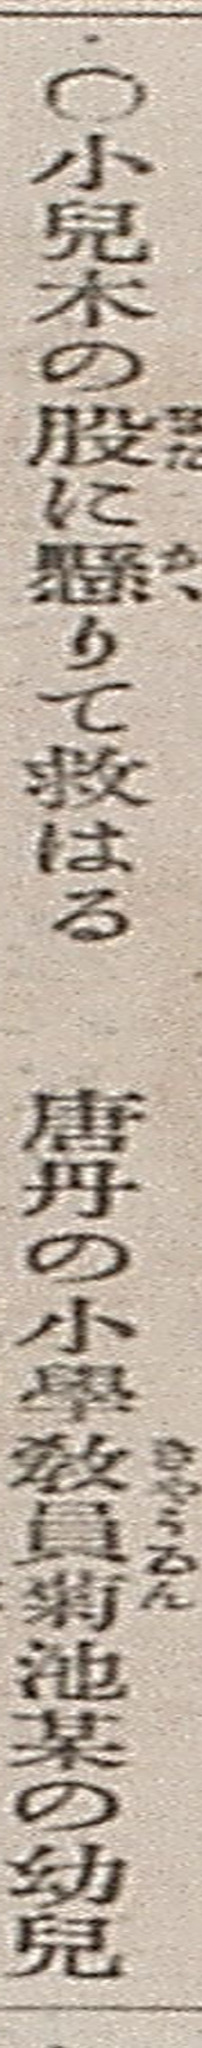○小児木の股に懸りて救はる唐丹の小学教員菊池某の幼児
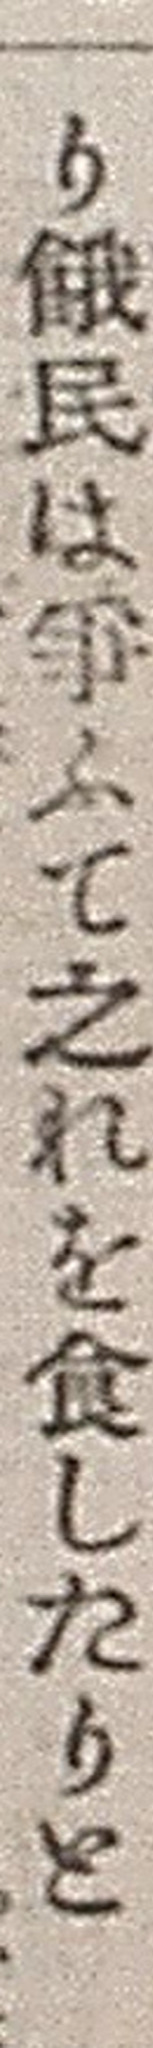り餓民は争ふて之れを食したりと
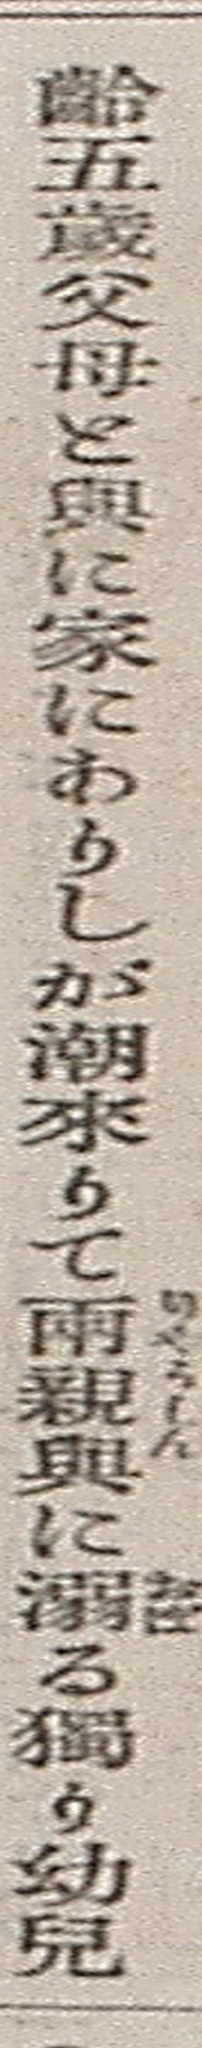齢五歳父母と与に家にありしが潮来りて両親与に溺る独り幼児
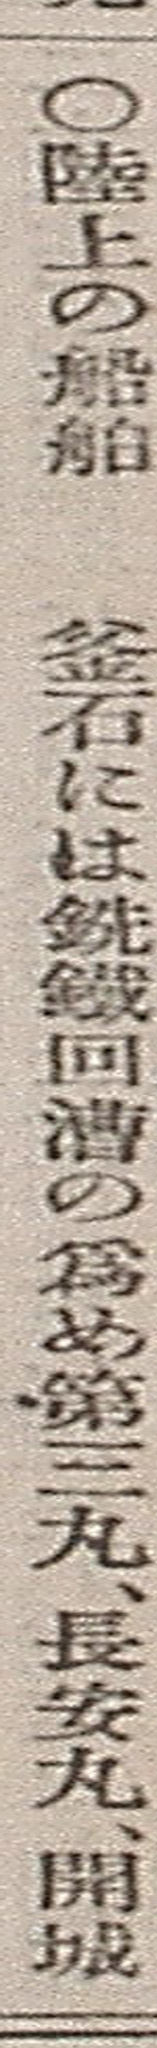○陸上の船舶釜石には銑鉄回漕の為め第三丸、長安丸、開城

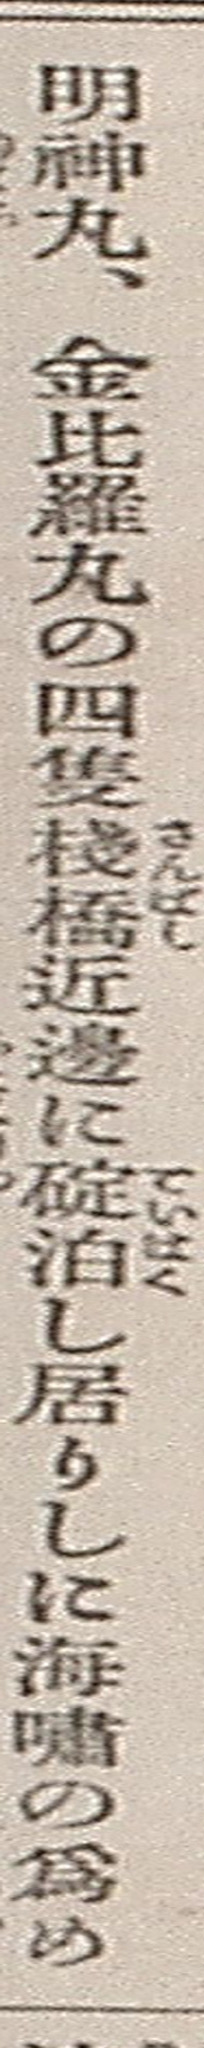明神丸、金毘羅丸の四隻桟橋近辺に碇泊し居りしに海嘯の為め
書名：風俗畫報臨時増刊第百十九號　大海嘯被害録（中）
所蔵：東京大学地震研究所図書室 Earthquake Research Institute Library, The University of Tokyo, JAPAN
